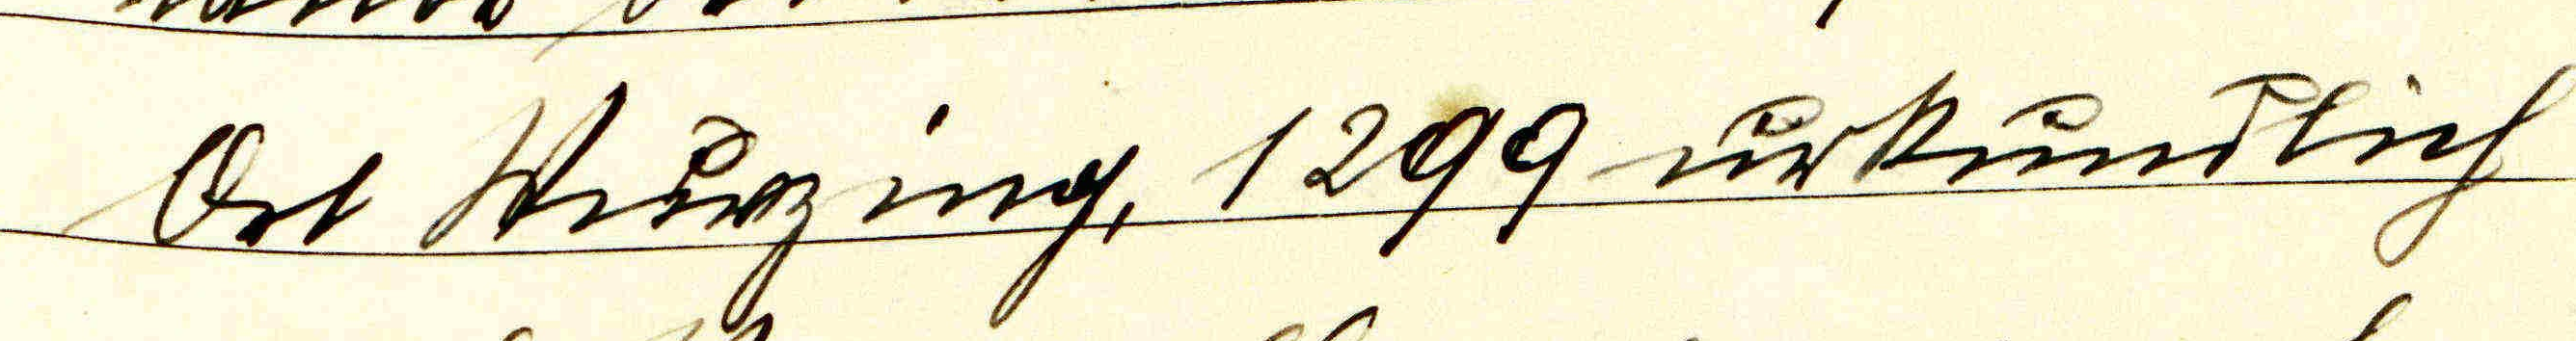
Ort Wurzing, 1299 urkundlich
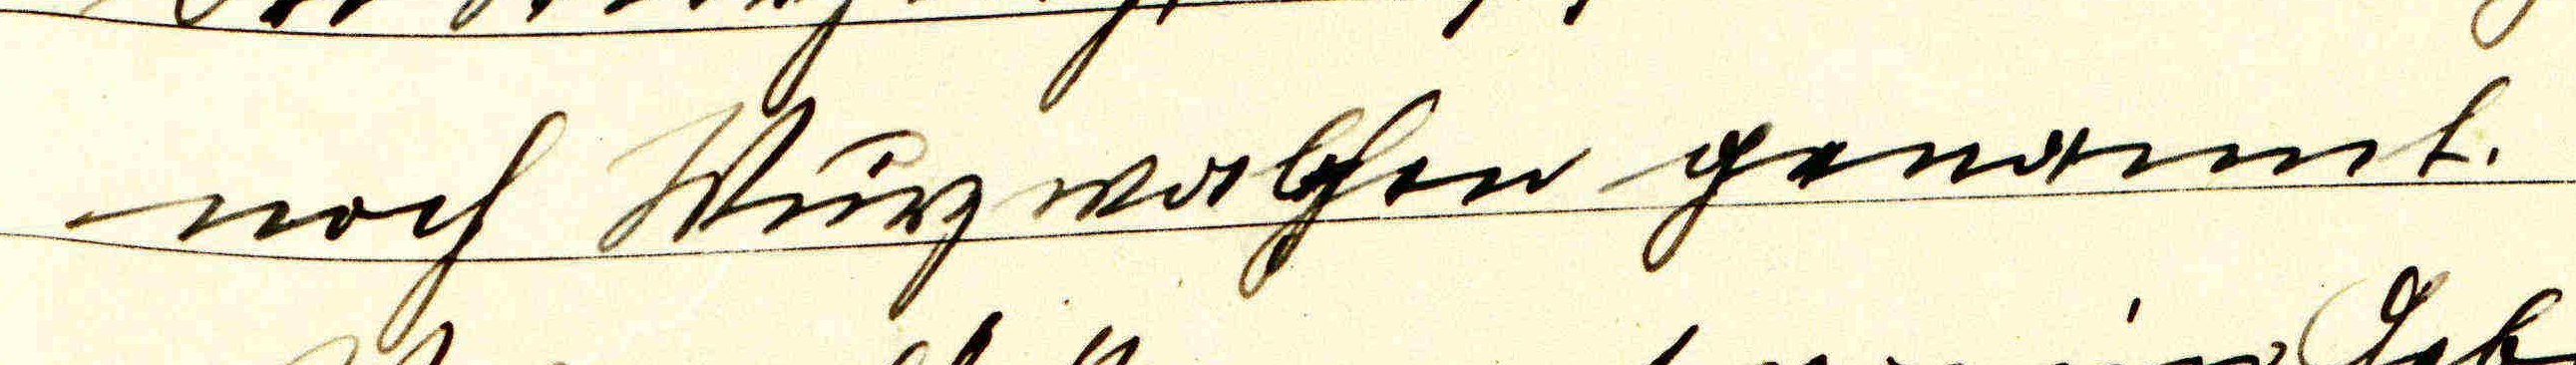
noch Wurzwalchen genannt.
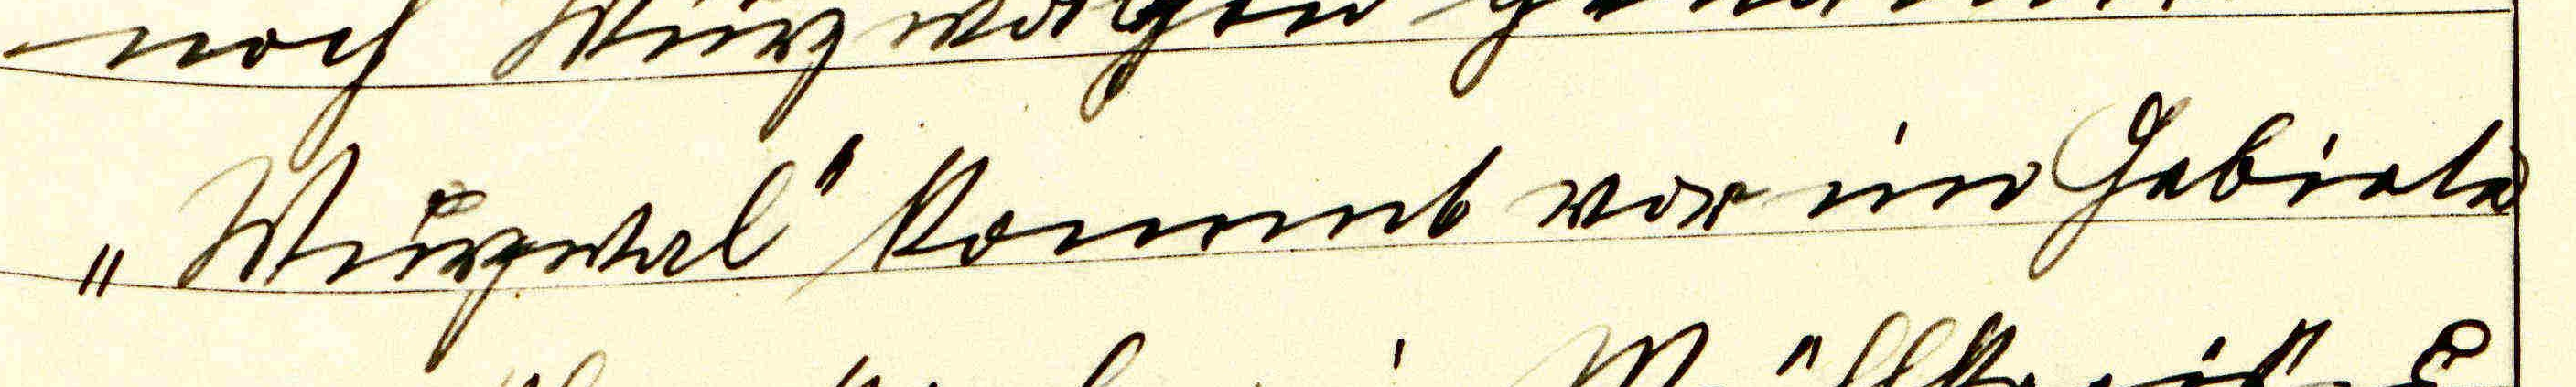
„Wurzwal“ kommt vor im Gebiete
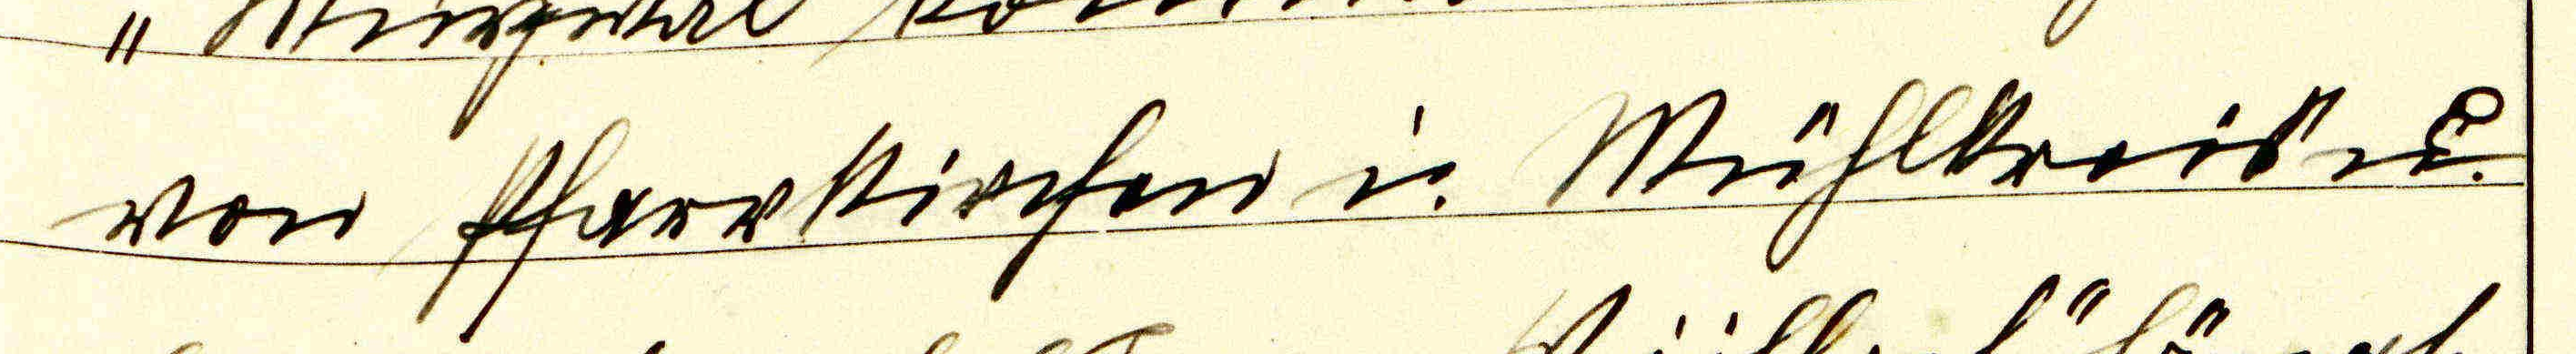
von Pfarrkirchen i. Mühlkreis u.
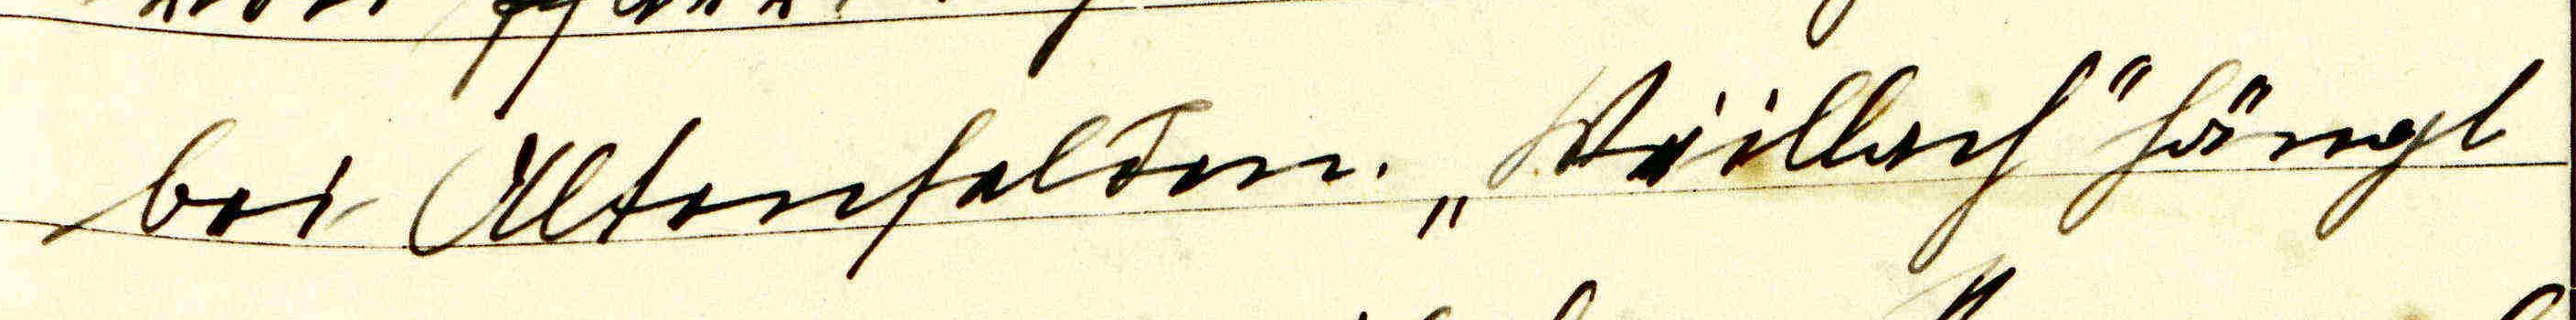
bei Altenfelden, „Weillach“ hängt
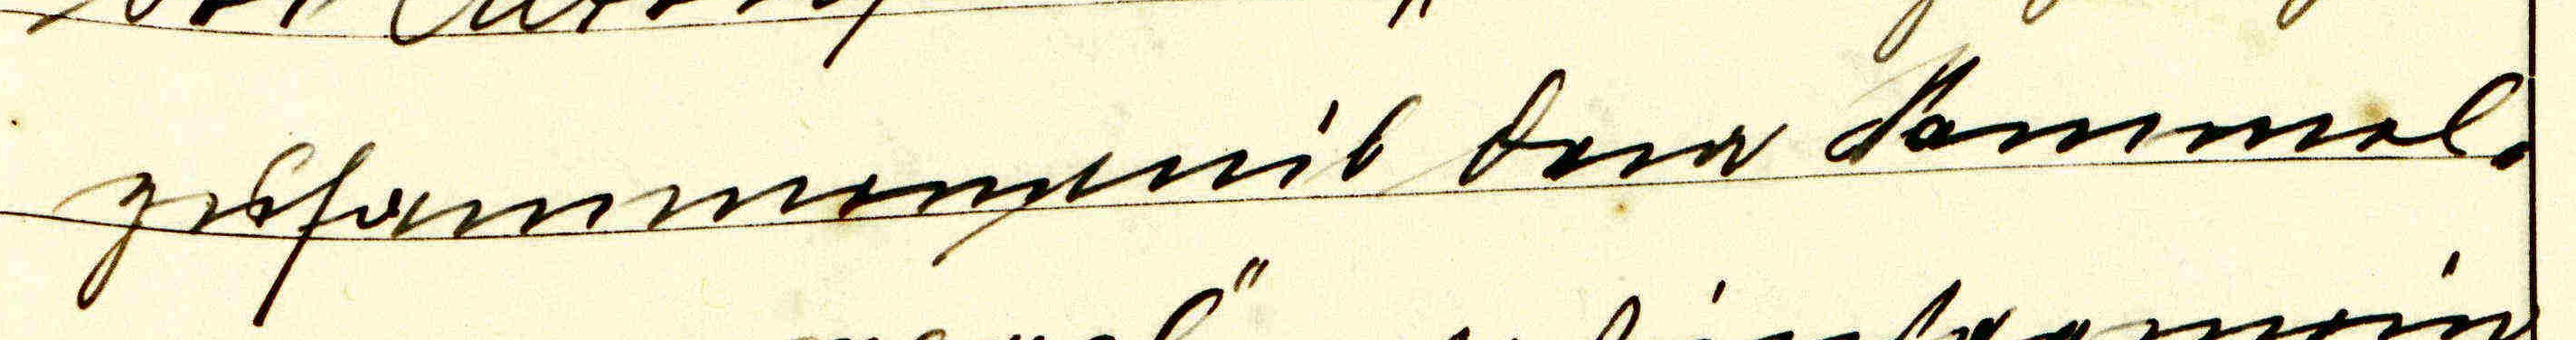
zusammen mit dem Sammel-
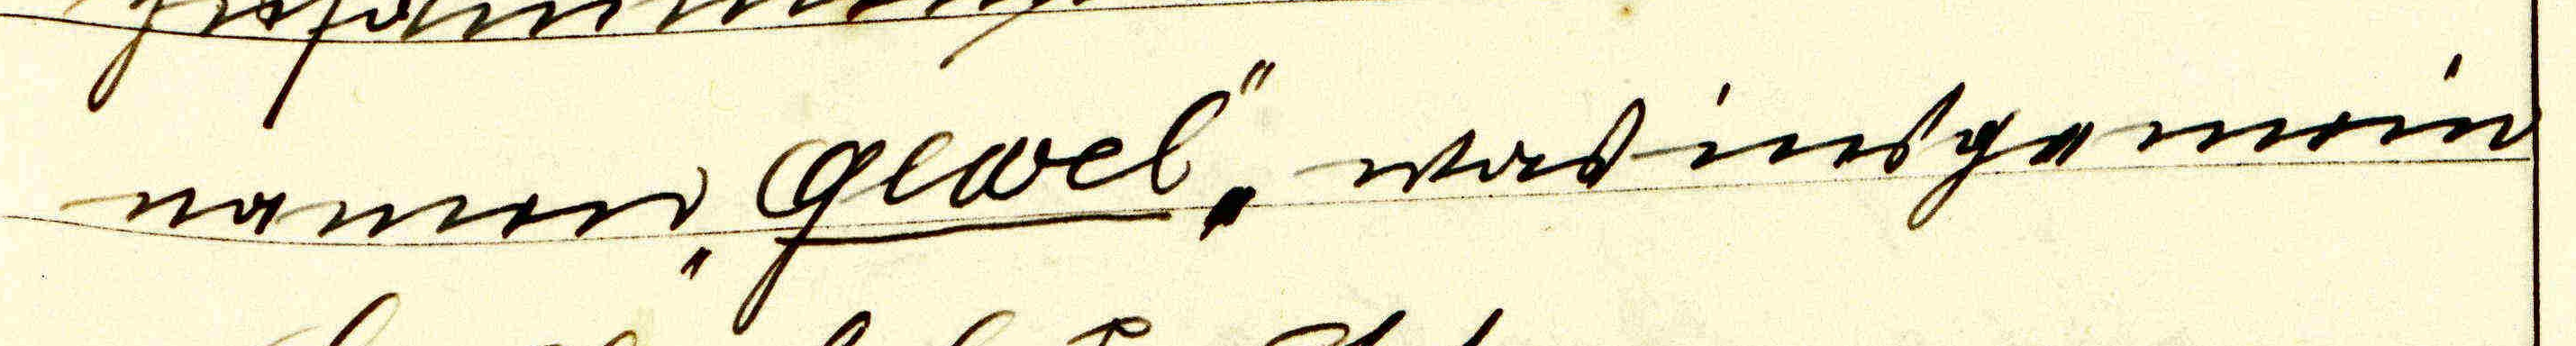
namen „Gewel“, was insgemein
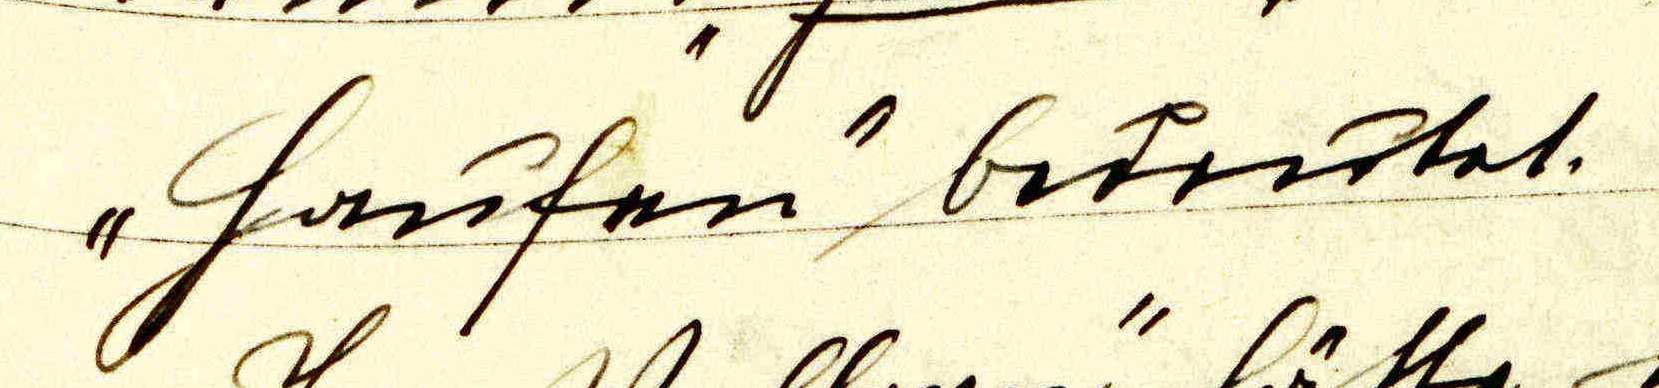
„Haufen“ bedeutet.
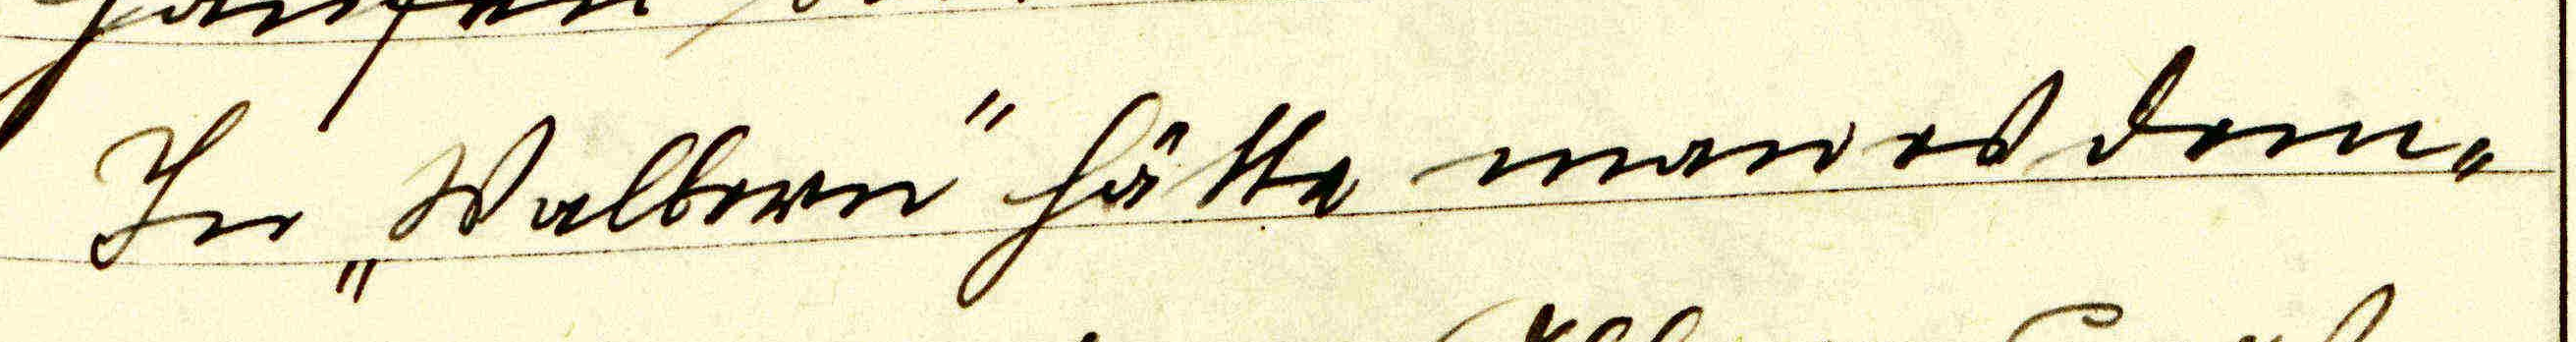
In „Wallern“ hätte man es dem-
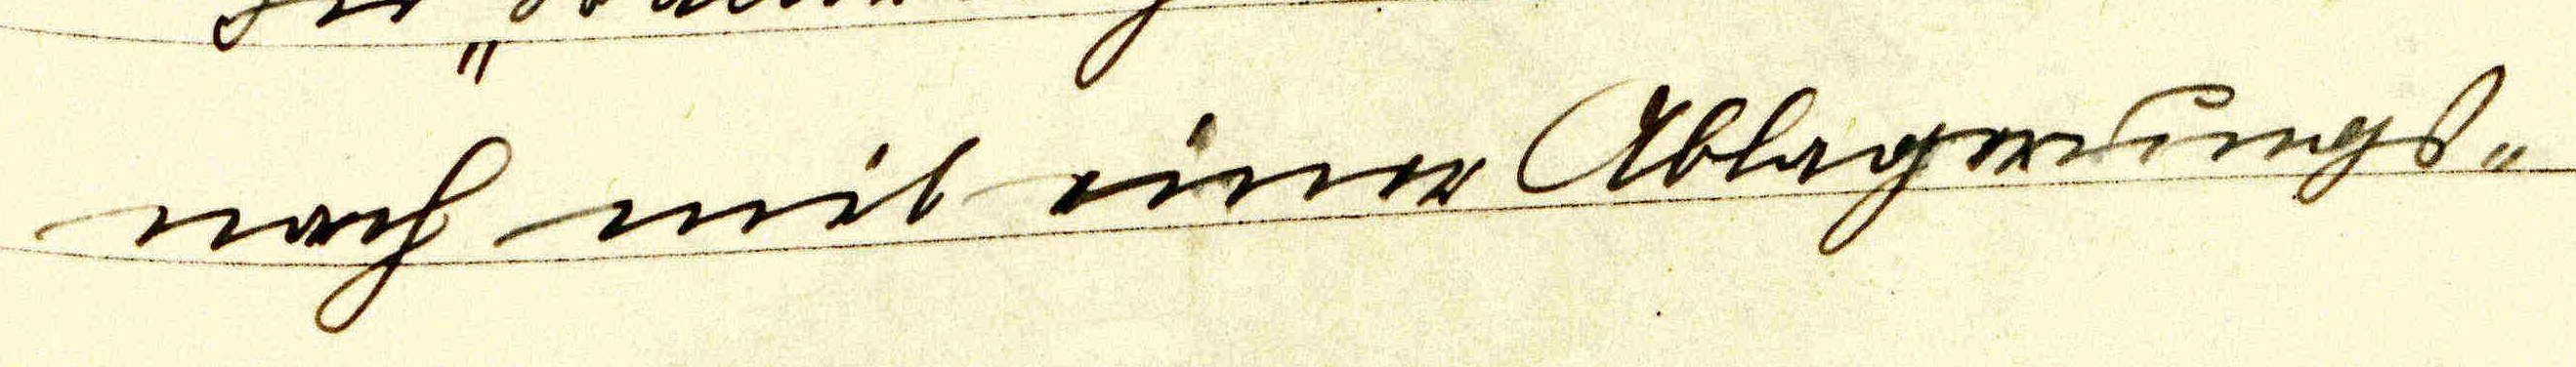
nach mit einer Ablagerungs-
